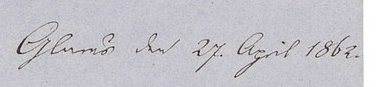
Glarus den 27. April 1862.
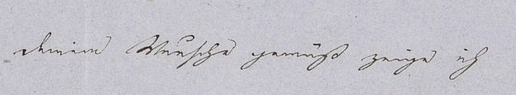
Deinem Wunsche gemäß zeige ich
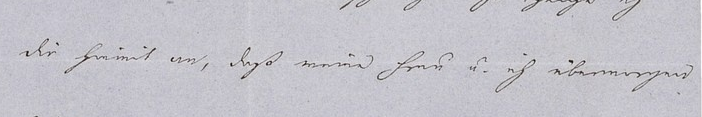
Dir hiemit an, daß meine Frau u. ich übermorgen
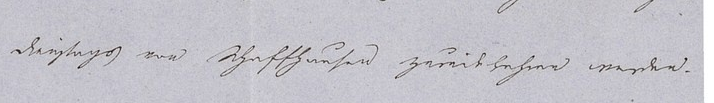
Dienstags von Schaffhausen zurückkehren werden.
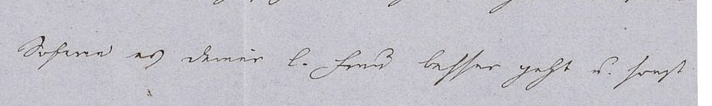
Soferne es Deiner l. Frau beßer geht u. sonst
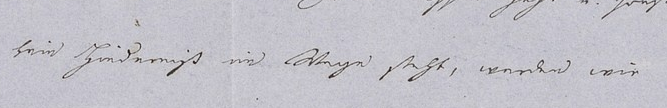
kein Hinderniß im Wege steht, werden wir
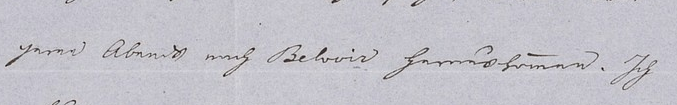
gerne Abends nach Belvoir herauskommen. Ich
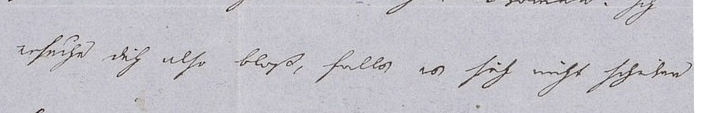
ersuche Dich also bloß, falls es sich nicht schiken
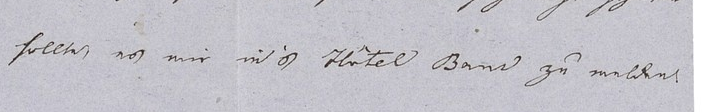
sollte, es mir in's Hôtel Baur zu melden.
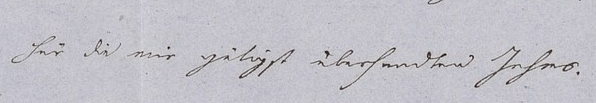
Für die mir gütigst übersandten Jahres-
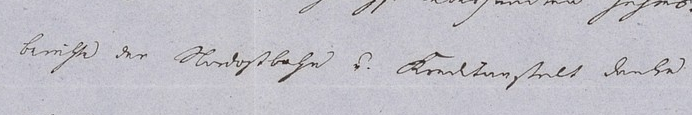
berichte der Nordostbahn u. Kreditanstalt danke
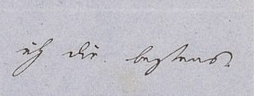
ich Dir bestens.
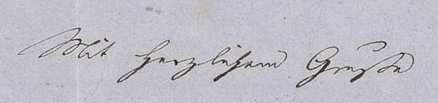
Mit herzlichem Gruße
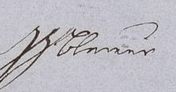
J J Blumer.
